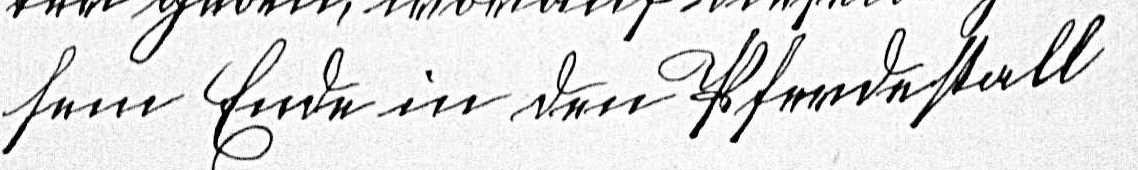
sem Ende in den Pferdestall
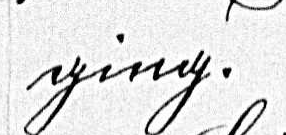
ging.
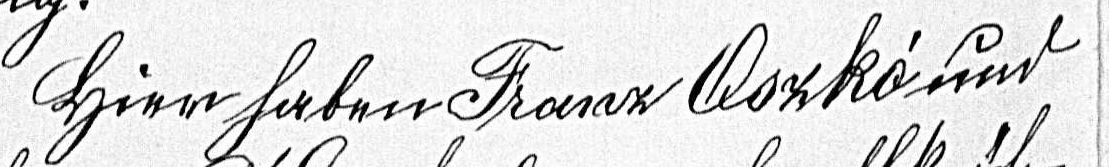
Hier haben Franz Oszkó und
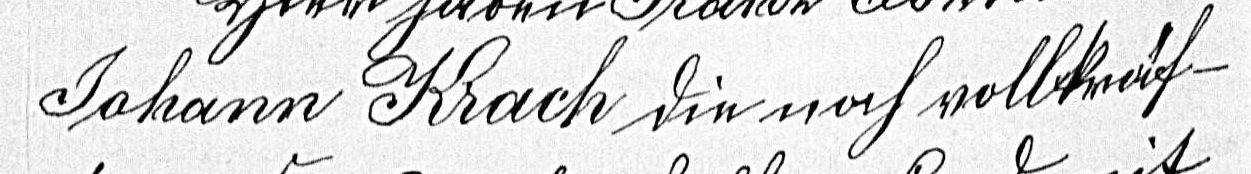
Johann Krach die noch vollkräf¬
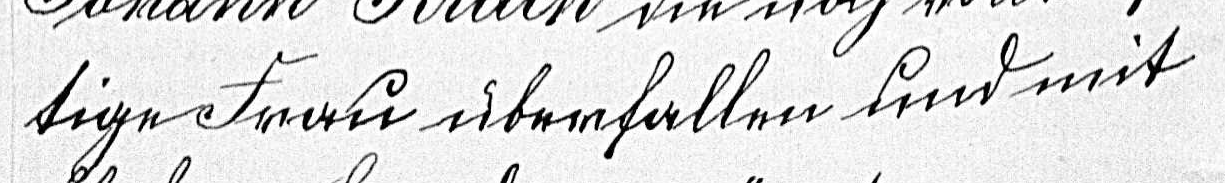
tige Frau überfallen und mit
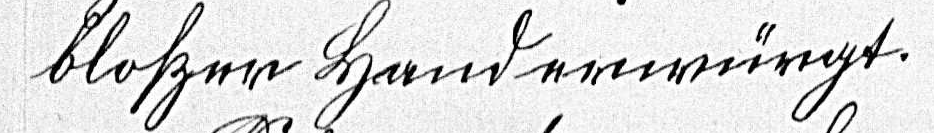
bloßer Hand erwürgt.
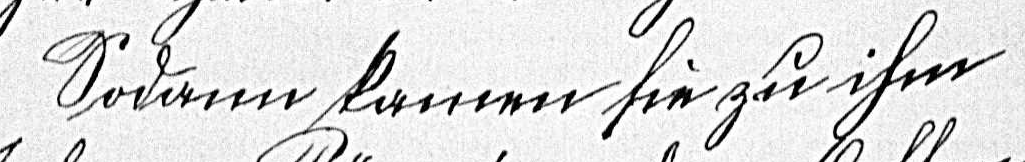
Sodann kamen sie zu ihm
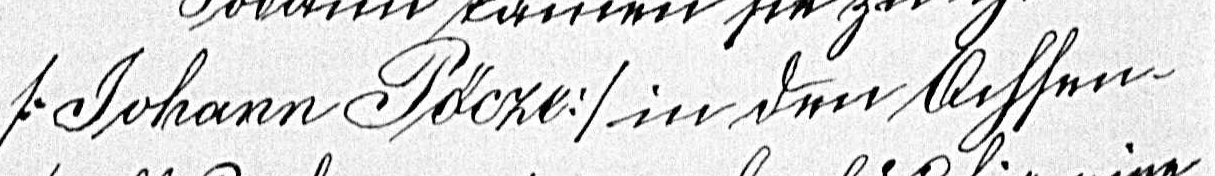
(Johann Pöcze) in den Ochsen¬
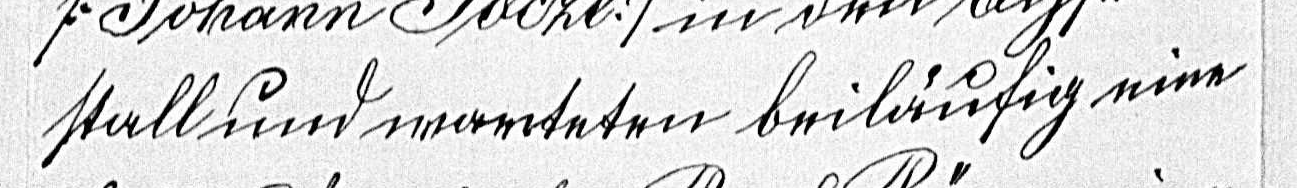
stall und warteten beiläufig eine
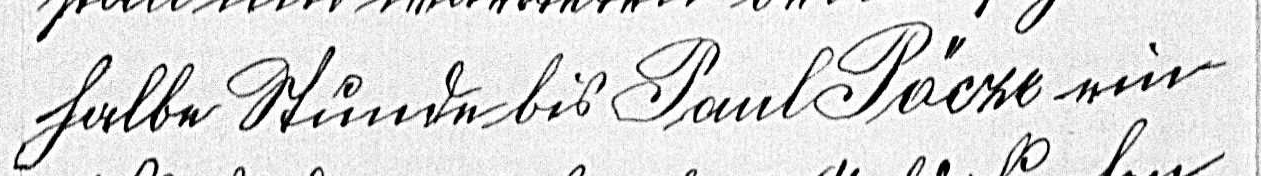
halbe Stunde bis Paul Pöcze ein¬
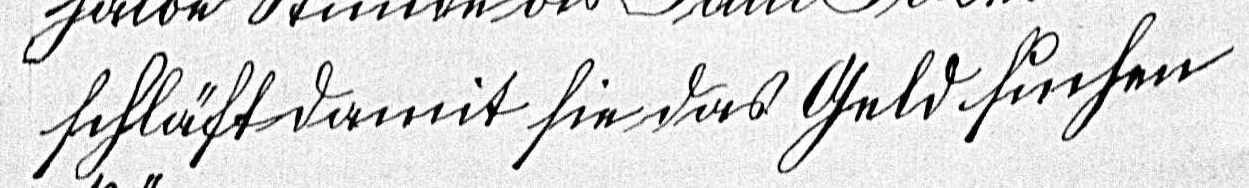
schläft damit sie das Geld suchen
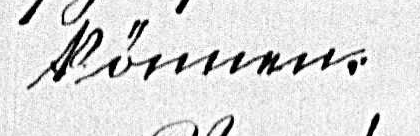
können.
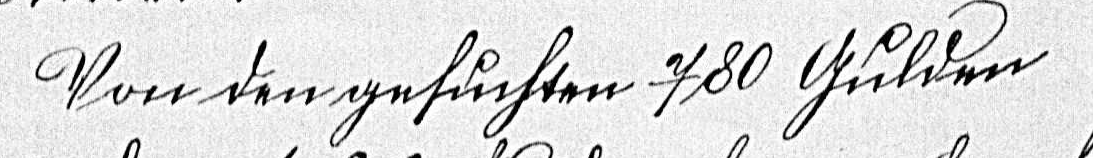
Von den gesuchten 780 Gulden
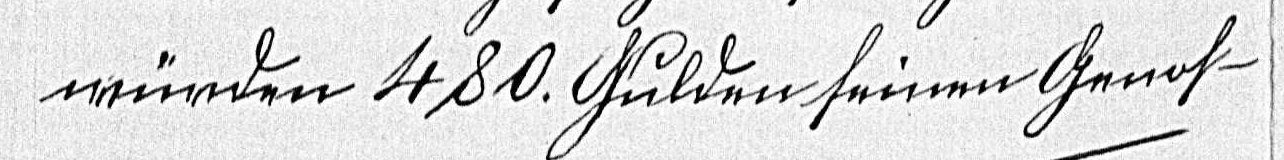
würden 480 Gulden seinen Genos¬
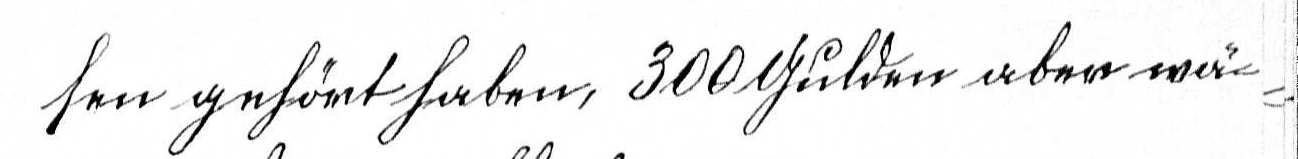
sen gehört haben, 300 Gulden aber wä¬
